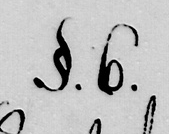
§. 6.
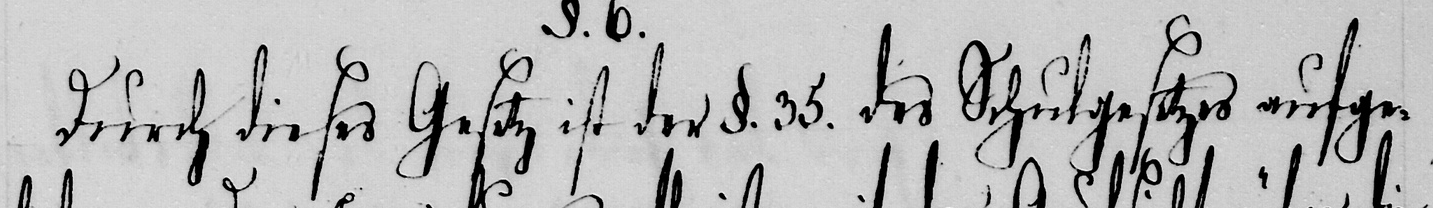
Durch dieses Gesetz ist der §. 35. des Schulgesetzes
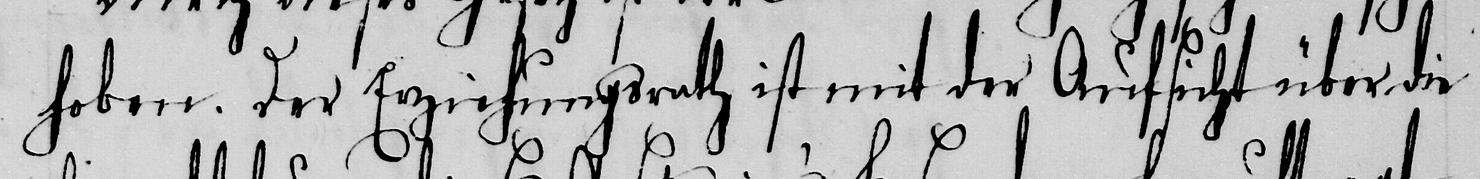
ehoben. Der Erziehungsrath ist mit der Aufsicht über die
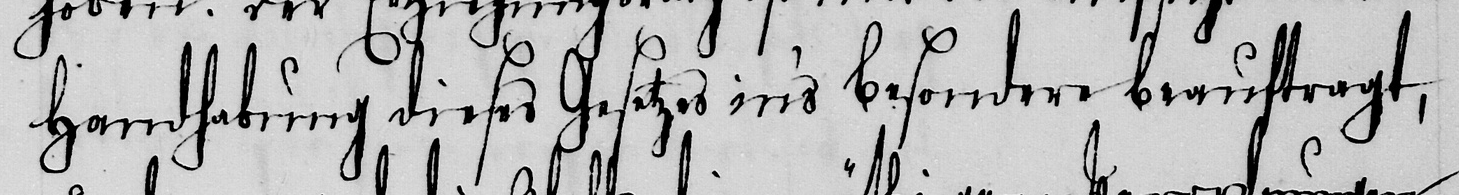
Handhabung dieses Gesetzes in’s Besondere beauftragt,
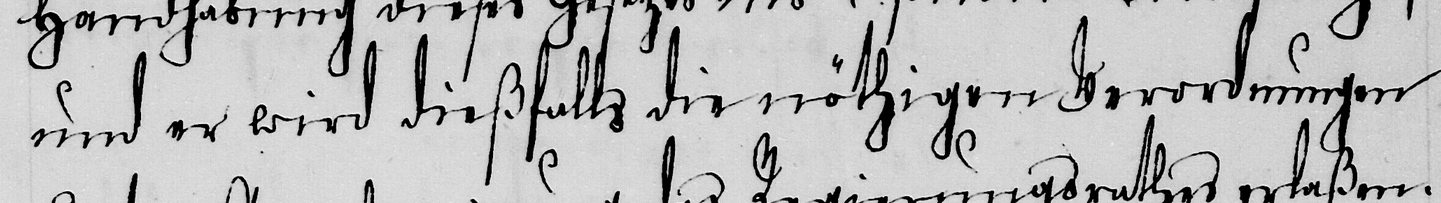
und er wird dießfalls die nöthigen Verordnungen
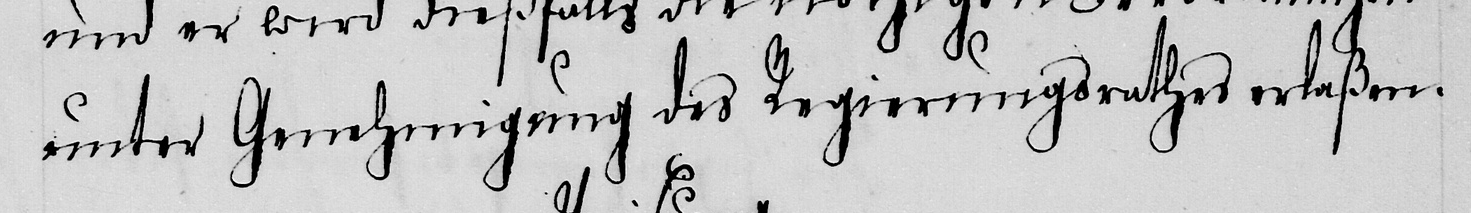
unter Genehmigung der Regierungsrathes erlaßen.
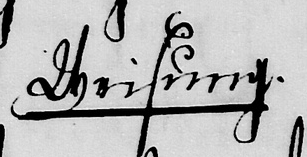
Weisung.
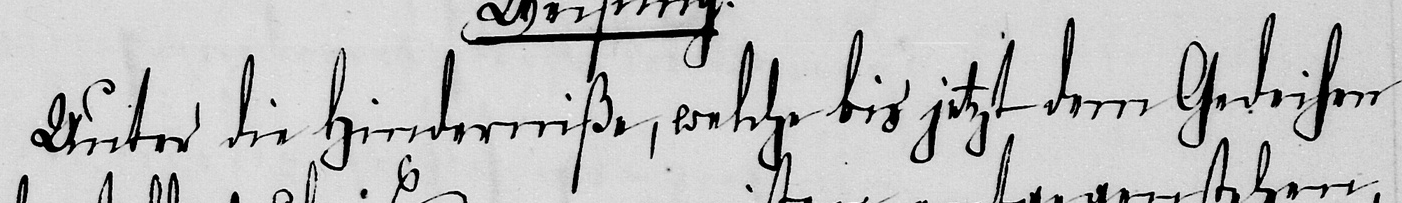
Unter die Hinderniße, welche bis jetzt dem Gedeihen
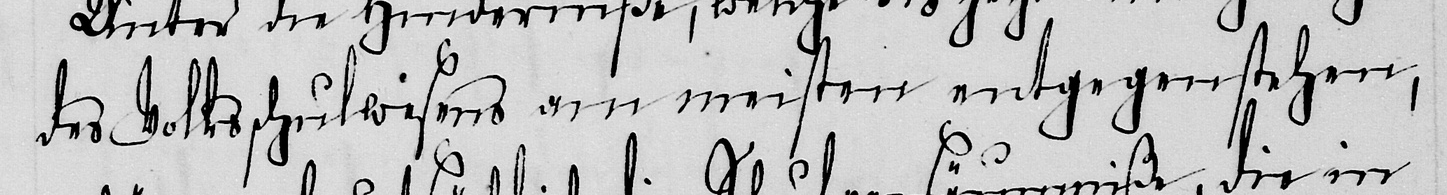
des Volksschulwesens am meisten entgegenstehen,
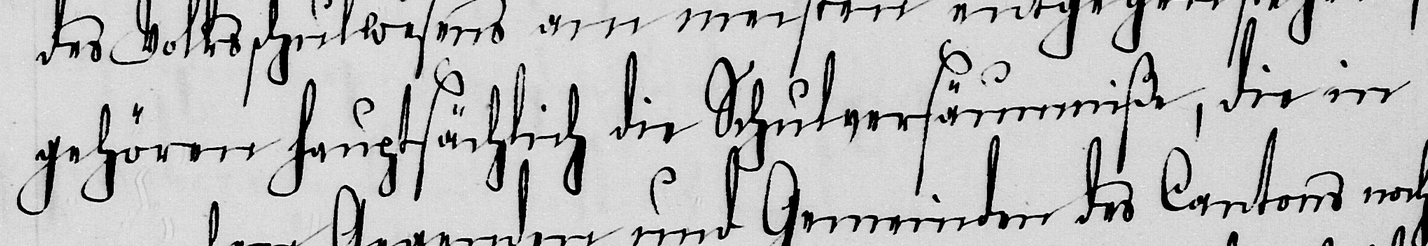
gehören hauptsächlich die Schulversäumniße, die in
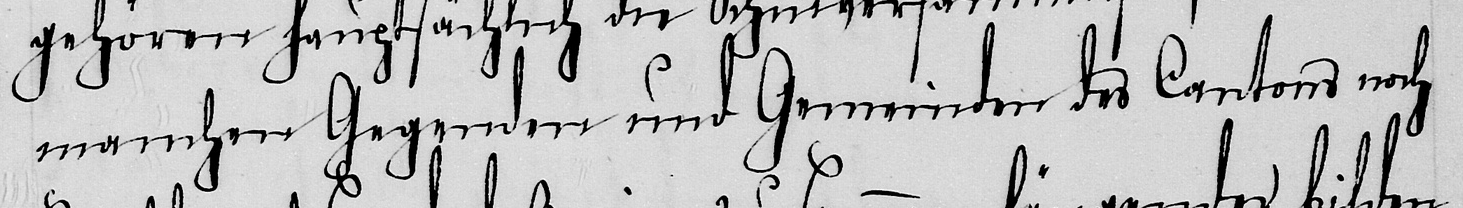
manchen Gegenden und Gemeinden des Cantons noch
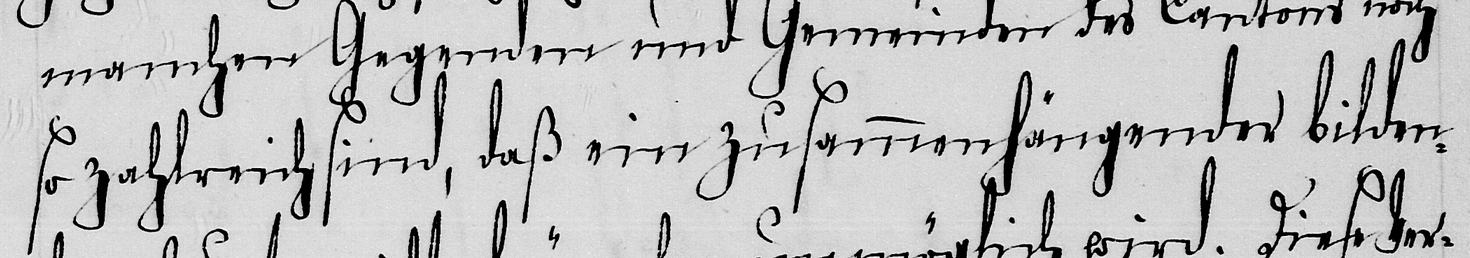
so zahlreich sind, daß ein zusammenhängender bilden¬
